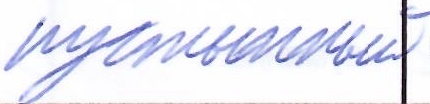пустынный
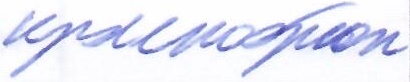краснобрюх
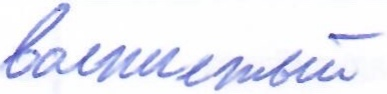волнистый
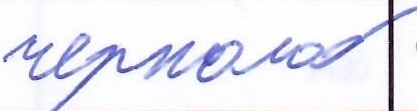чернолоб
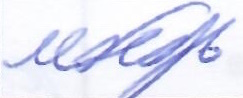лебедь
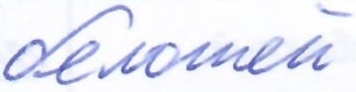белошей
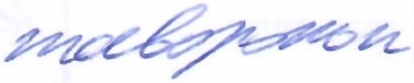жаворонок
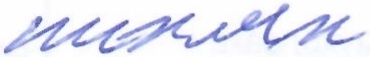пихляк
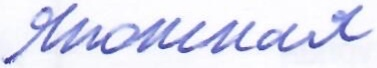японская
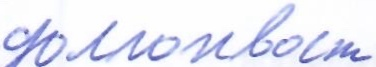долгохвост
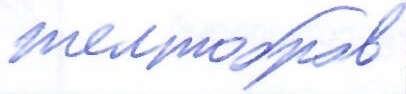желтобров
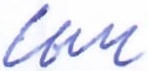сыч
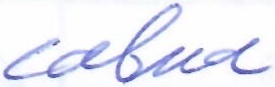савка
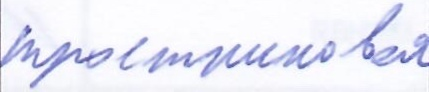тростниковая
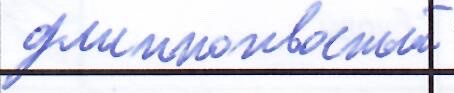длиннохвостый
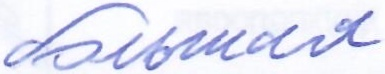большая
